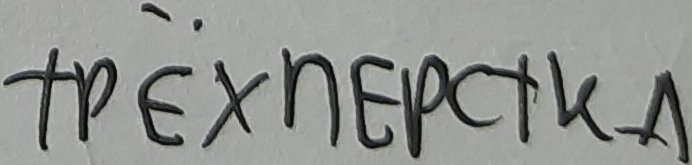трёхперстка
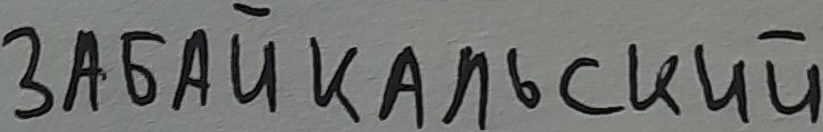забайкальский
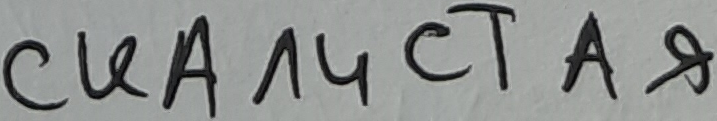скалистая
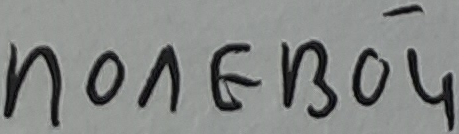полевой
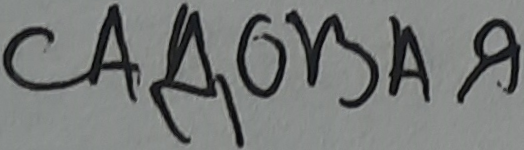садовая
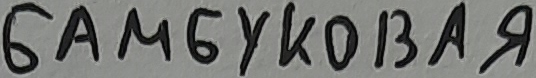бамбуковая
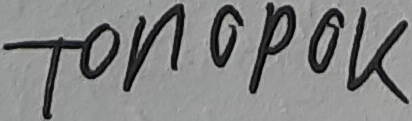топорок
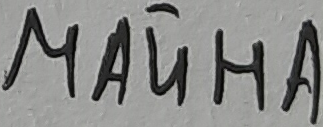майна
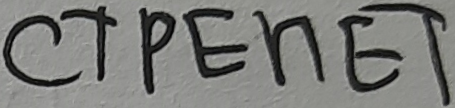стрепет
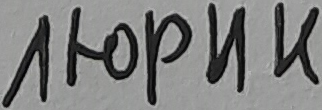люрик
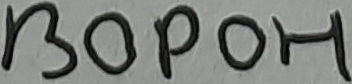ворон
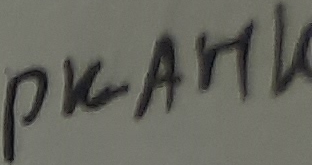рканк
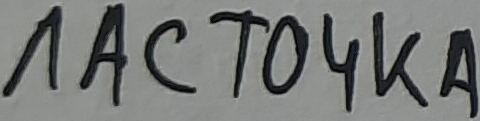ласточка
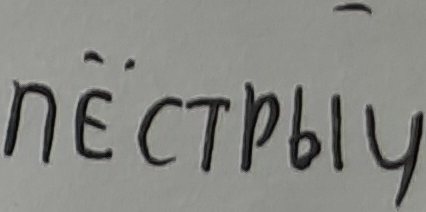пёстрый
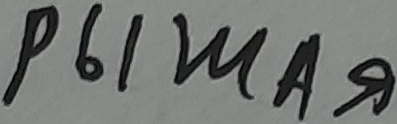рыжая
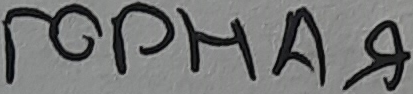горная
